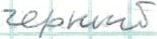черный
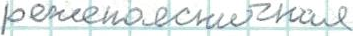режепоясничная
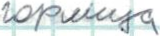горлица
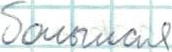большая
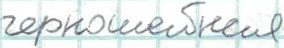черношейная
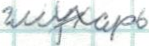глухарь
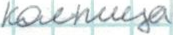колпица
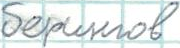берингов
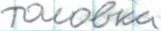таловка
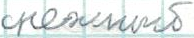снежный
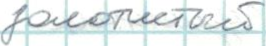золотистый
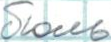бюль
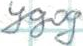удод
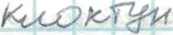клоктун
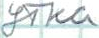утка
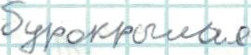бурокрылая
